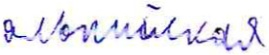альпийская
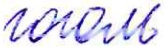гоголь
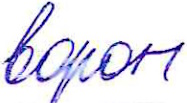ворон
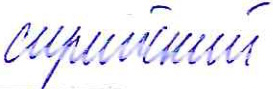сирийский
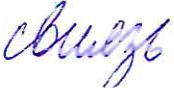свиязь
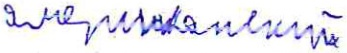американский
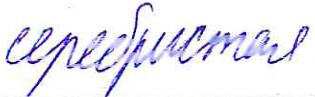серебристая
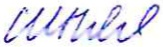синяя
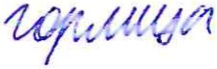горлица
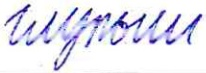глупыш
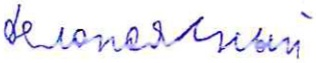белопоясный
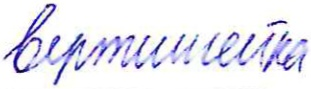вертишейка
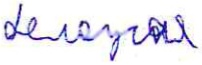белоусая
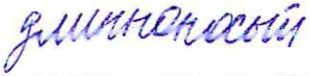длинноносый
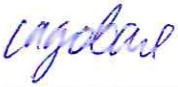садовая
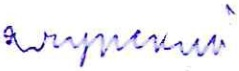амупский
